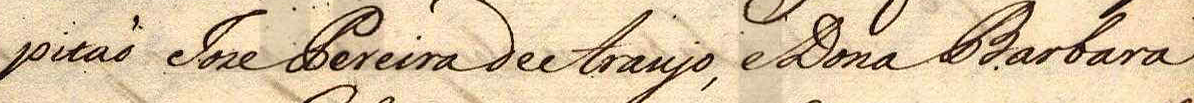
pitaõ Ioze Pereira de Araujo, e Dona Barbara
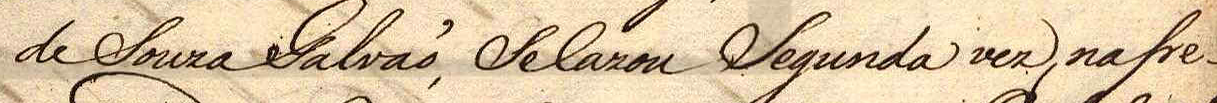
de Souza Galvaõ, Se Cazou Segunda vez na fre
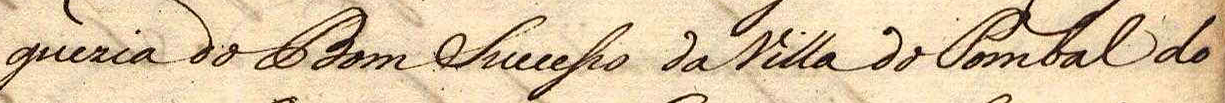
guezia do Bom Successo da Villa do Pombal do
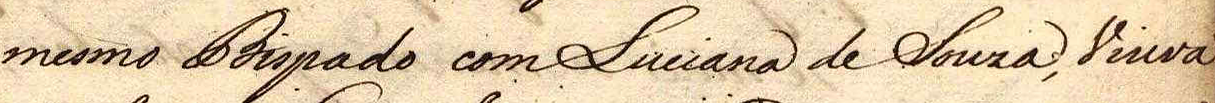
mesmo Bispado com Luciana de Souza, Viuva
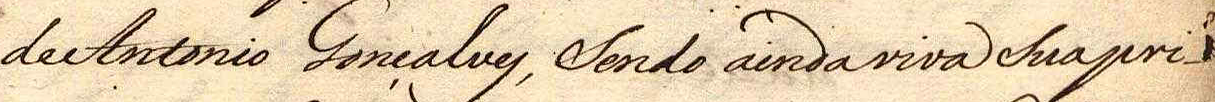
de Antonio Gonçalves, Sendo ainda viva sua pri
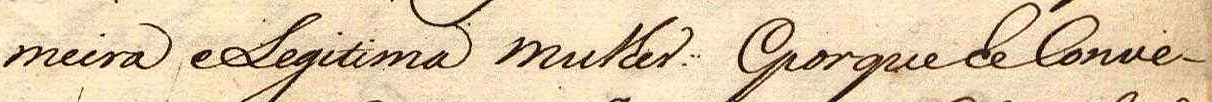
meira e Legitima mulher. e porque he Conve
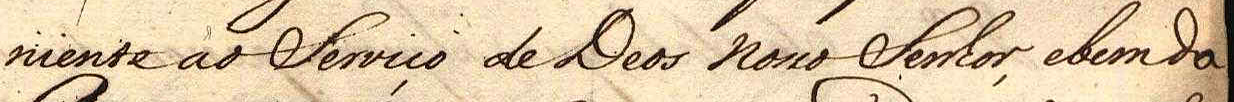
niente ao Serviço de Deos nosso Senhor, e bem da
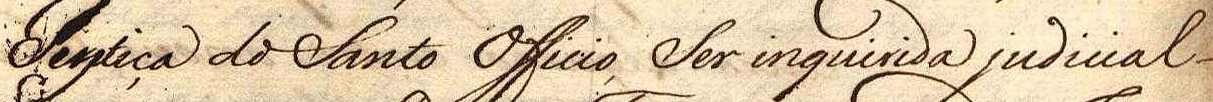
Iustiça do Santo officio, Ser inquirida judicial
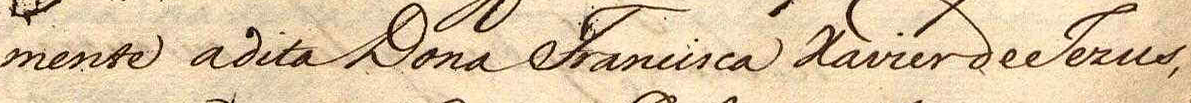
mente a dita Dona Francisca Xavier de Iezus,
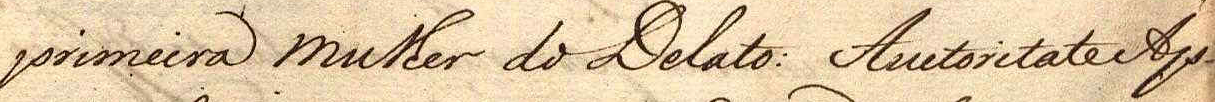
primeira mulher do Delato: Auctoritate Ap
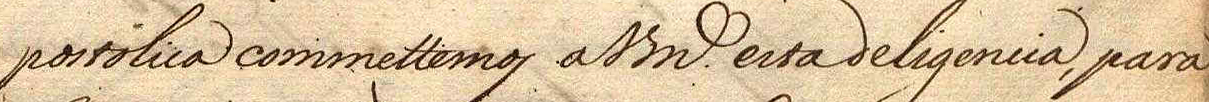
postolica commettemos a Vm.e esta deligencia, para
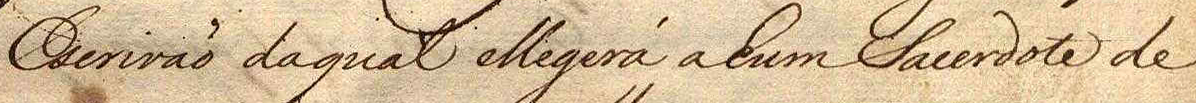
escrivaõ da qual ellegerá a hum Sacerdote de
